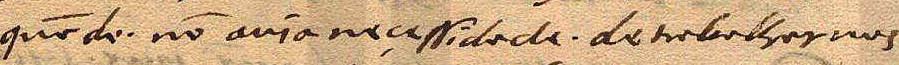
quādo. nō auia neçessidade. de trabalhar nas
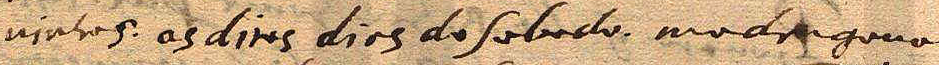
uinhas. os ditos dias do sabado . madrugaua
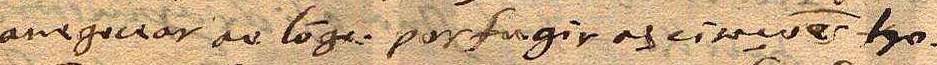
a negocear ao lōge. por fugir as citações ho
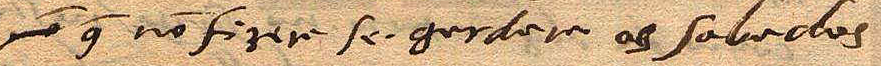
q̄ nō fizera se. gardara os sabados
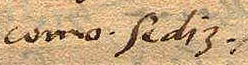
como. se diz ./
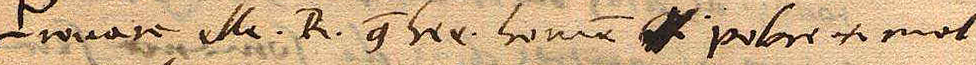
Prouara elle .R. q̄ hee. homē _ pobre e mal
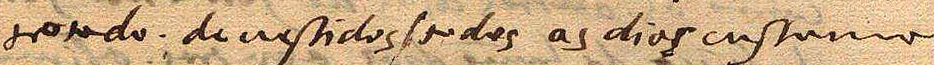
tratado. de uestidos / todos os dias custuma
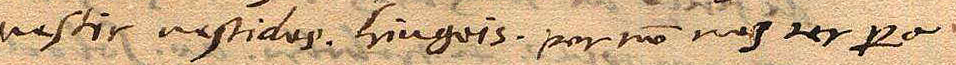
uestir uestidos. hingais. por nō nos ter ꝑa
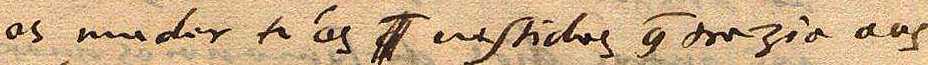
os mudar e ós _ uestidos q̄ trazia aos
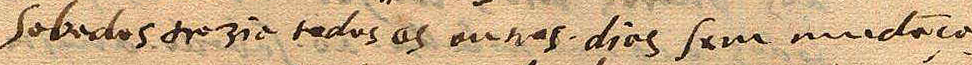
sabados trazia todos os outros. dias sem mudāça
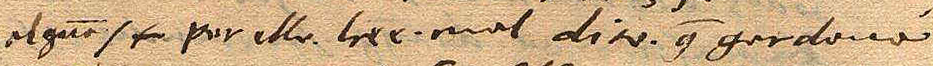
alguā / e por ello. hee. mal dito. q̄ gardaua
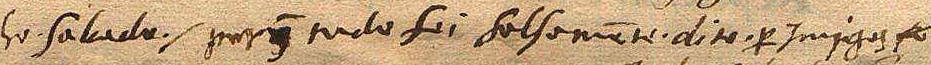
ho. sabado ./ porq̄ tudo foi falsamēte. dito. ꝑ Jmjgos _
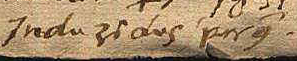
Jnduzidos porq̄
